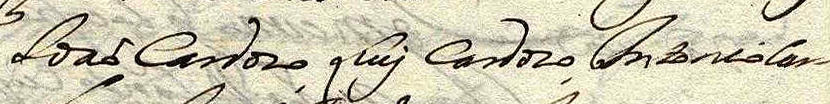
Ioaõ Cardozo, Luis cardozo, Antonio Car
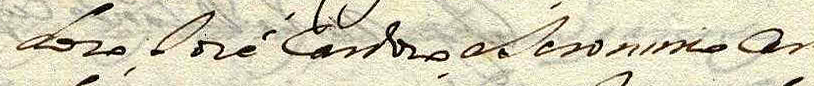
dozo, Iozé Cardozo, e Ieronimo car
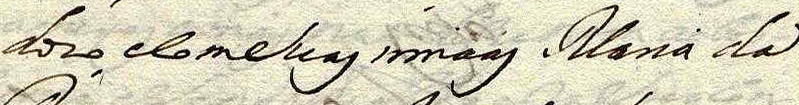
dozo, e Com Suas irmaas Maria da
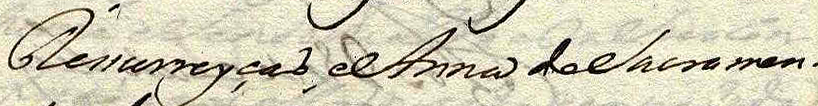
Ressurreyçaõ, e Anna do Sacramen
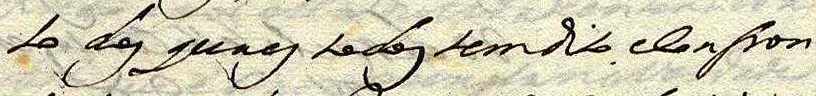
to dos quaes todos tem dito, e Confron
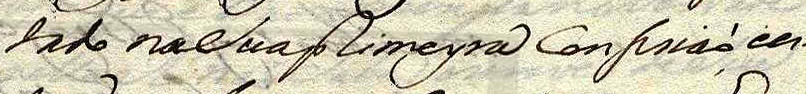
tado na Sua pRimeyra Confissaõ, e es
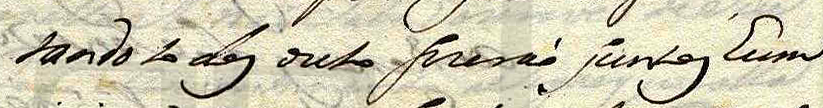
tando todos outo fizeraõ juntoz hum
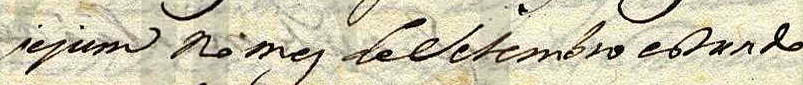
jejum no mes de Setembro estando
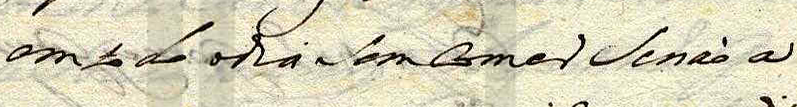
em todo o dia sem comer senaõ a
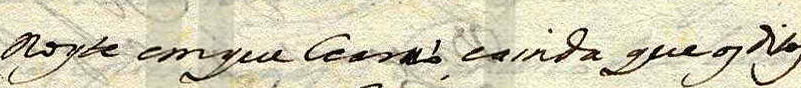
noyte em que Cearaõ, e ainda que os ditos
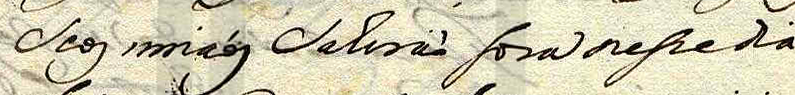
seos irmaõs sahiraõ fora nesse dia
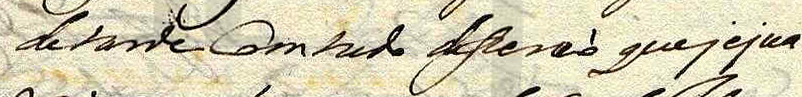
de tarde Com tudo disseraõ que jejua
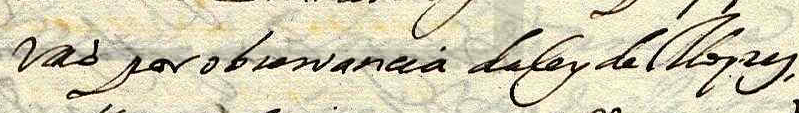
vaõ por observancia da Ley de Moyzes,
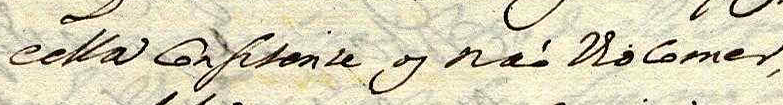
e ella Confitente os não Vio comer,
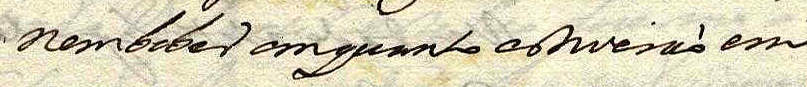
nem beber emquanto estiveraõ em
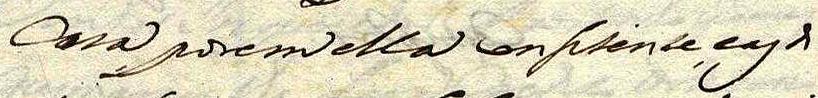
caza porem ella confitente, e as di
